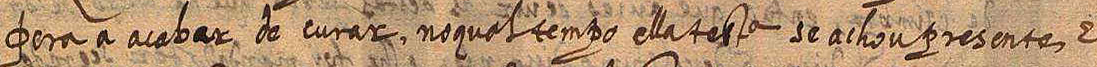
pera a acabar de curar, no qual tempo ella testa se achou presente E
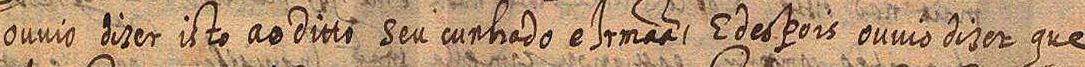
ouuio dizer isto ao ditto seu cunhado e Irmāa / E despois ouuio dizer que
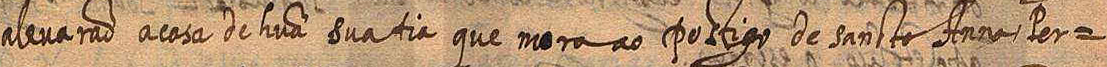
a leuarão a casa de huā sua tia que mora ao postigo de sancta Anna, Per
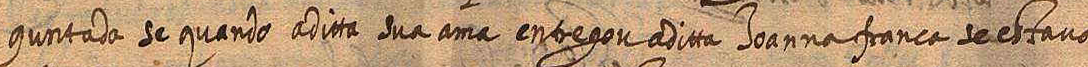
guntada se quando a ditta sua ama entregou a ditta Ioanna franca se estaua
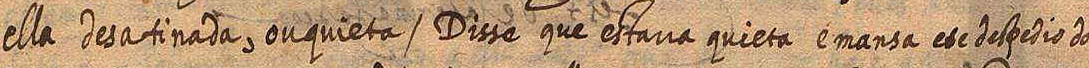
ella desatinada, ou quieta / Disse que estaua quieta e mansa e se despedio da
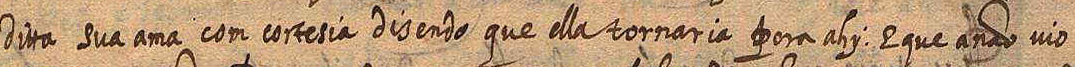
ditta sua ama com cortesia dizendo que ella tornaria pera ahy E que a não uio
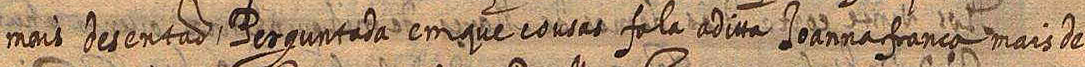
mais des então / Perguntada em que cousas fala a ditta Ioanna franca mais de
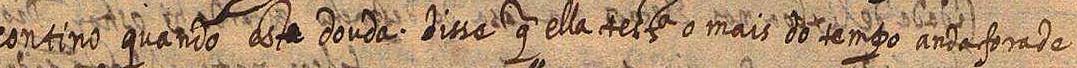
contino quando esta douda. disse q̄ ella testa o mais do tempo anda fora de
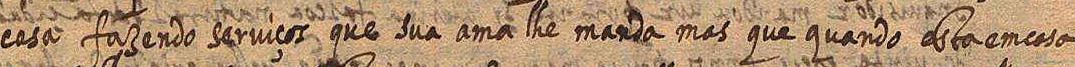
casa fazendo seruiços que sua ama lhe manda mas que quando esta em casa
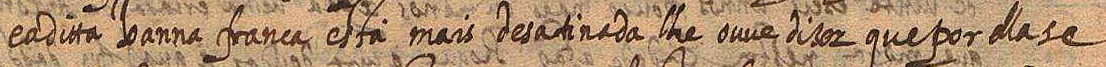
e a ditta Ioanna franca esta mais desatinada lhe ouue dizer que por ella se
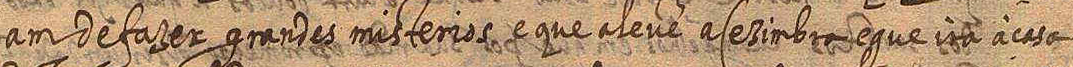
am de fazer grandes misterios e que a leuē a Cezimbra e que ira à casa
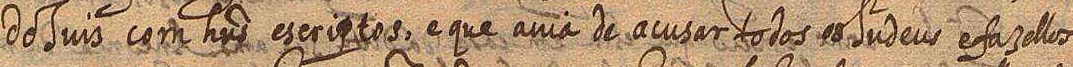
do Iuiz com hūs escriptos, e que auia de acusar todos os Iudeus e fazellos
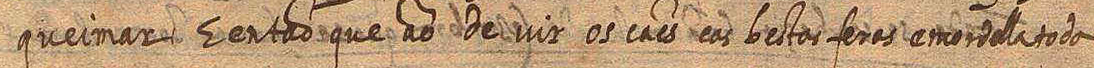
queimar E então que ão de uir os caẽs e as bestas feras e mordella toda
